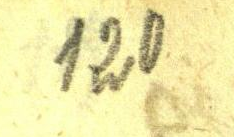120
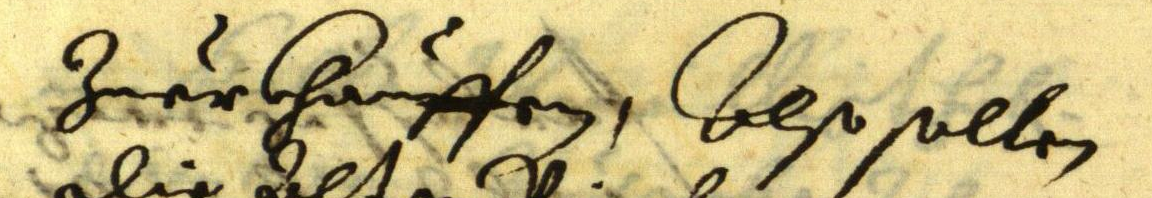Zūerkhaūffen, Also sollen
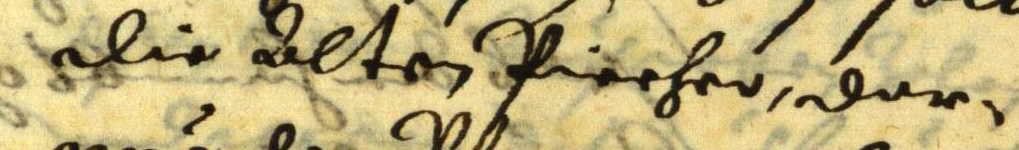die Alten Piecher, dar¬
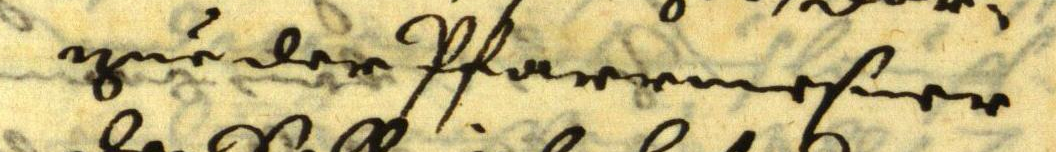zūe der Pfarrmesner
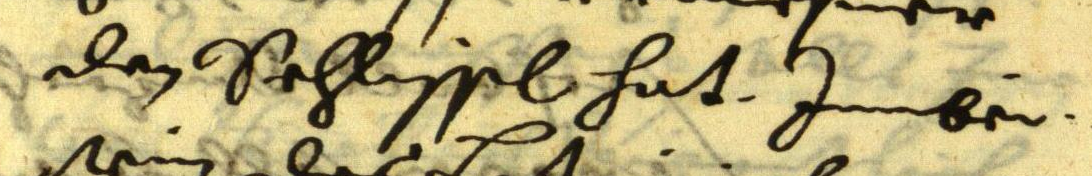den Schlissl hat. Innbei¬
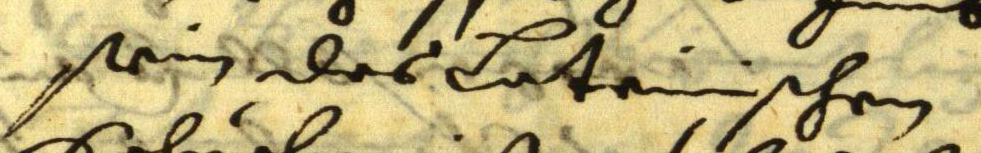sein des Lateinischen
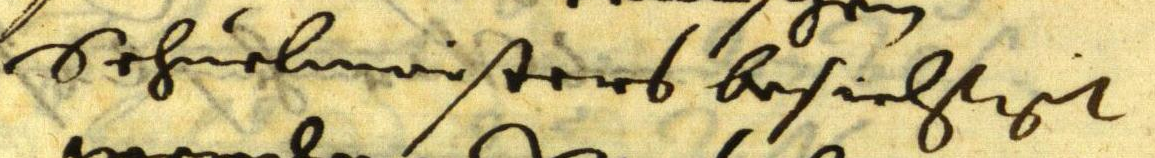Schūelmaisters besichtigt
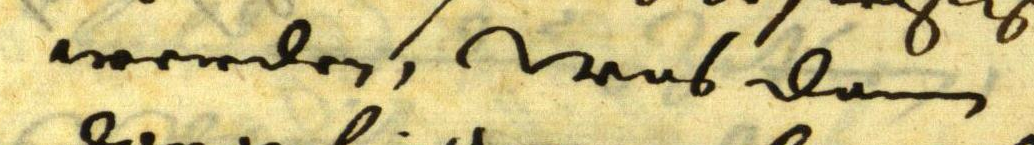werden, Was dann
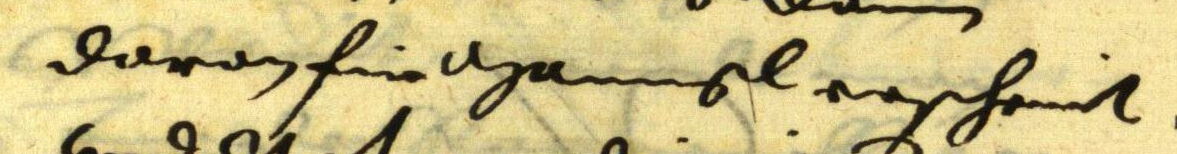daran fir Manngl erscheint.
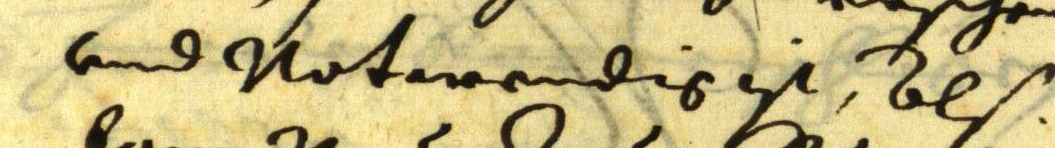vnd Notwendig ist, Als¬
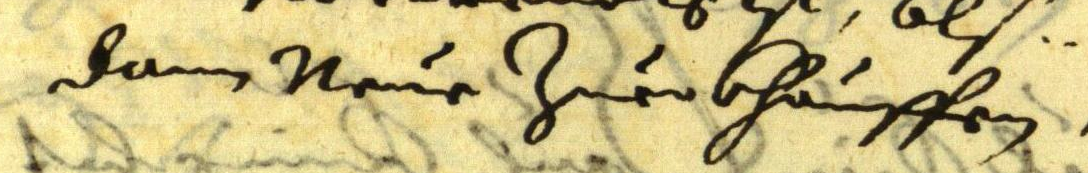dann Neūe Zūerkhaūffen.
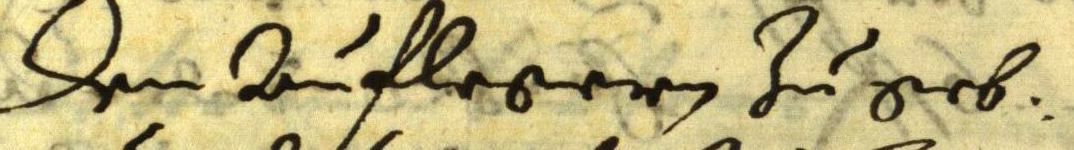Den Aūflegern Zū geb¬
